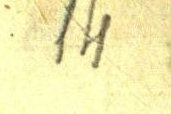14
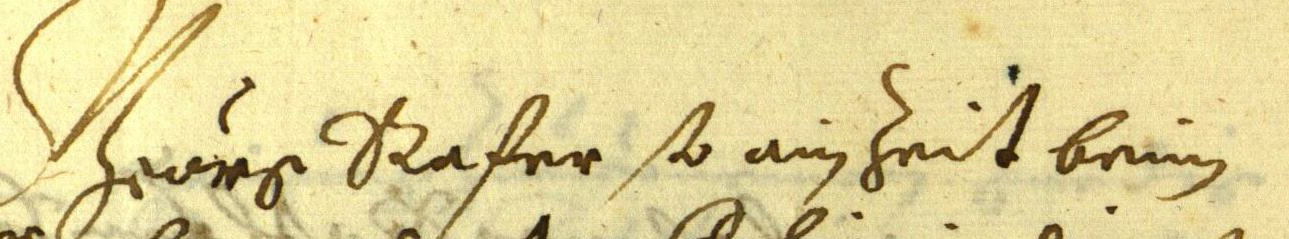Geōrg Rafer so ain Zeit beim
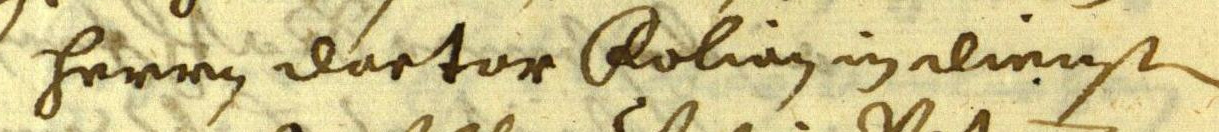herrn doctor Folian in dienst
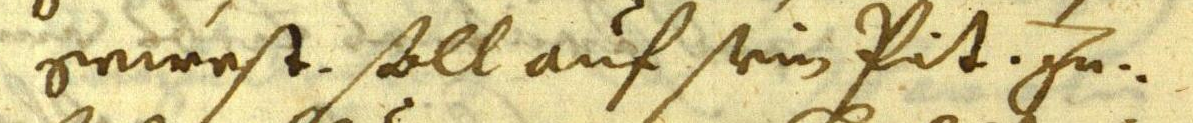gewest. soll aūf sein Pit. In¬
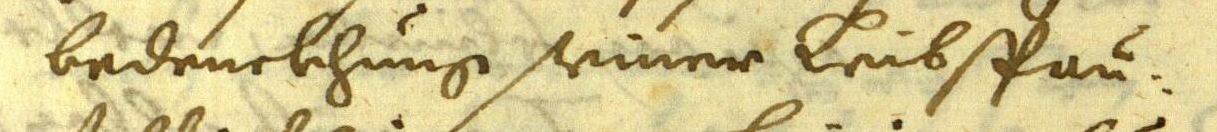bedenckhūng seiner LeibsPaū¬
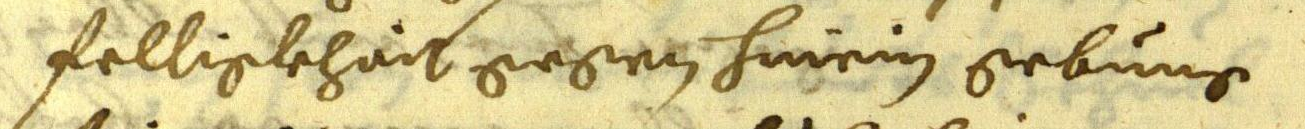felligkhait gegen hinein gebūng
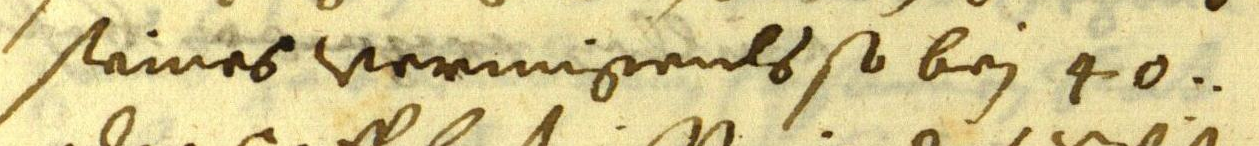seines vermigends so bei 40¬
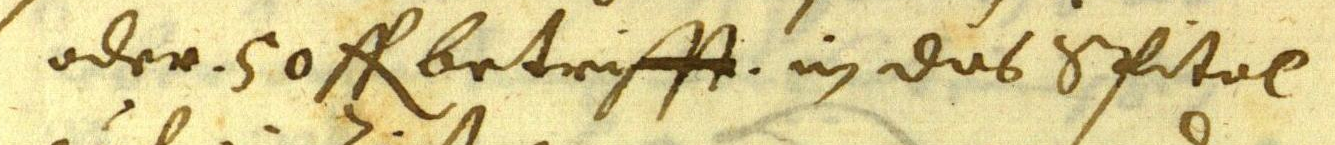oder. 50 fl betrifft. in das Spital
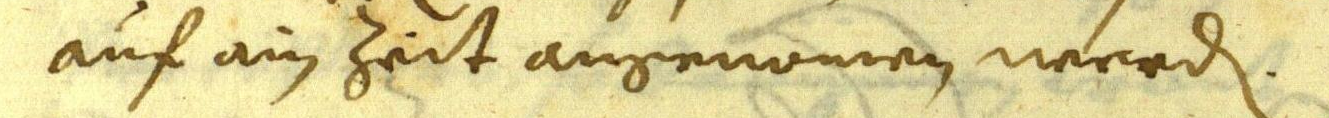aūf ain Zeit angenomen werd.
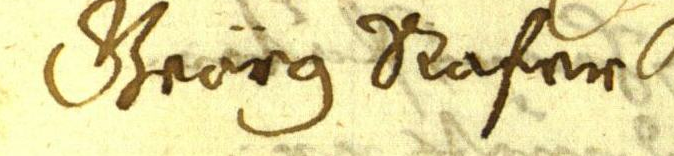Geörg Rafer
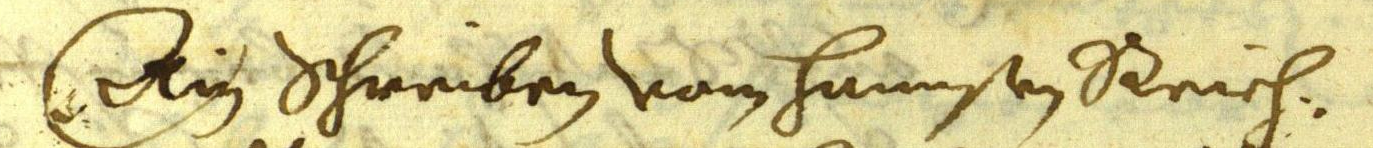Ain Schreiben vom hannsen Reich¬
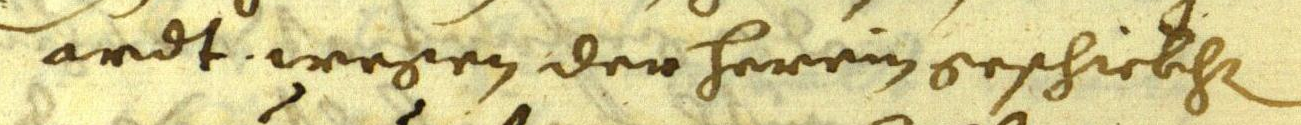ardt. wegen der herein geschickht
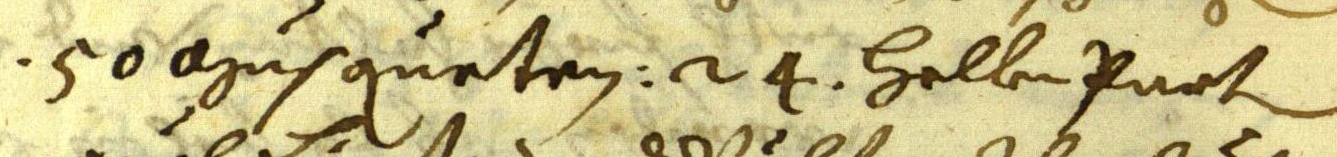.50 Mūsqūeten. 24. Hellen Part
